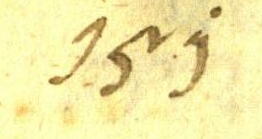151
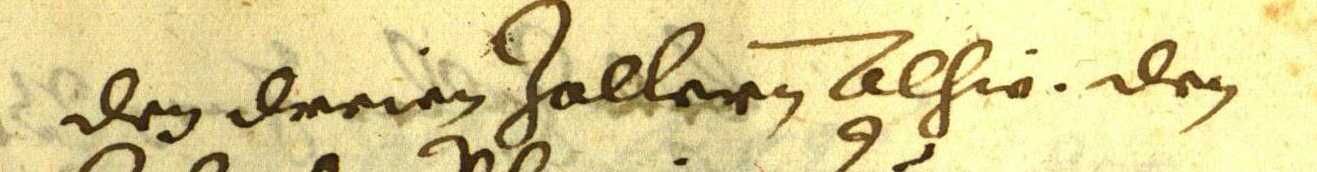den dreien Zollern Alhie. den
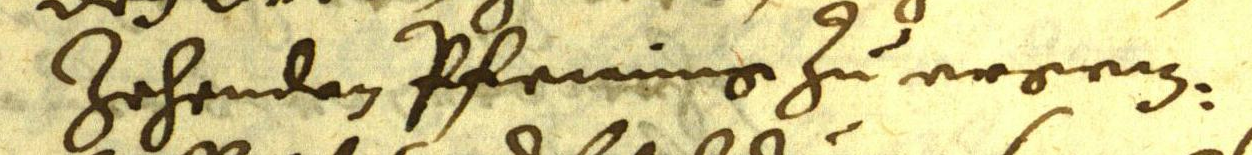Zehenden Pfening Zū ergez¬
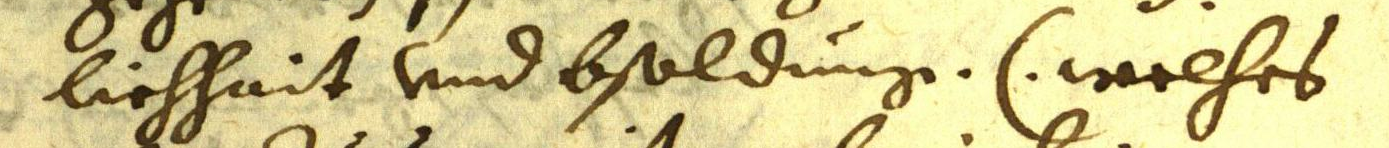lichhait vnd bsoldūng .(.welhes
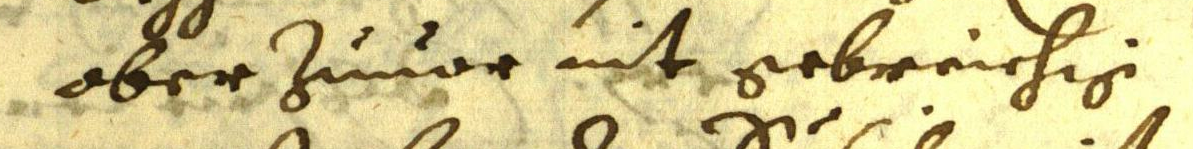aber Zūūor nit gebreichig
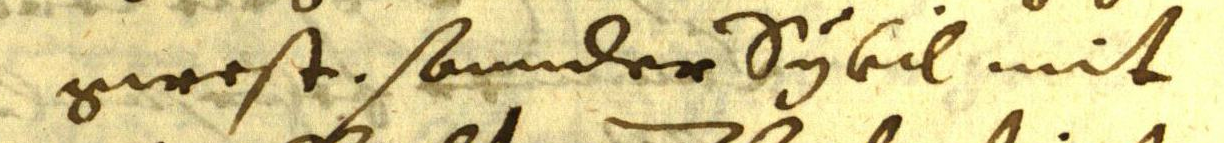gwest. sonnder Sȳ vil mit
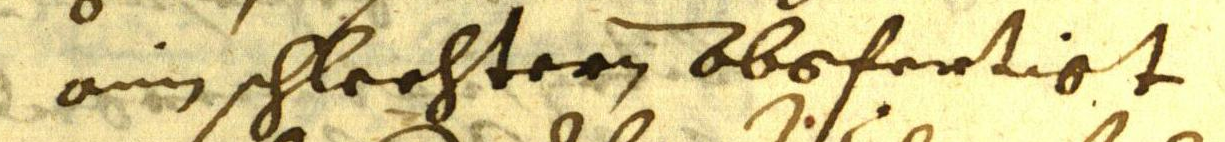aim schlechtern Abgfertigt
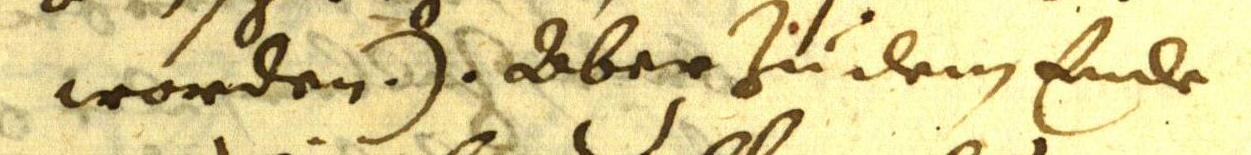worden.). Aber Zū dem Ende
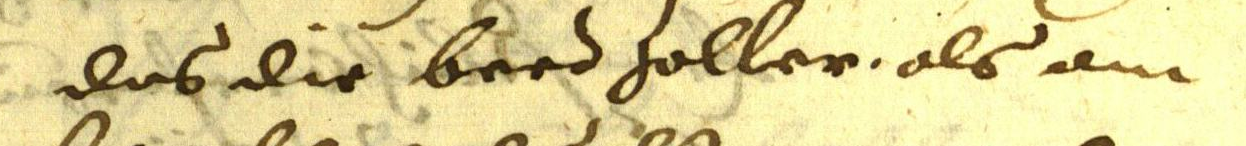das die beed Zoller. als am
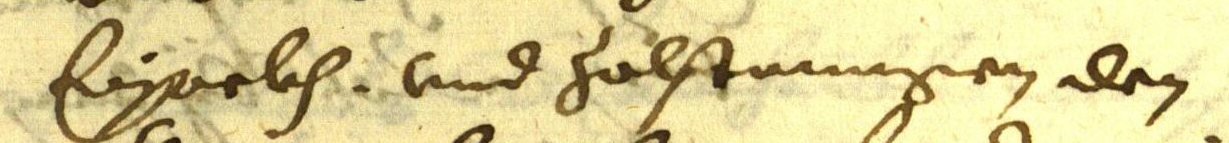Eisackh. vnd Zolstanngen den
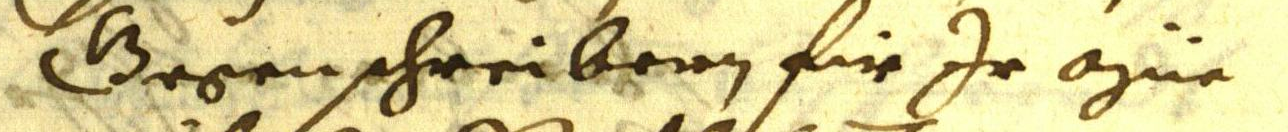Gegenschreibern fir Ir Müe
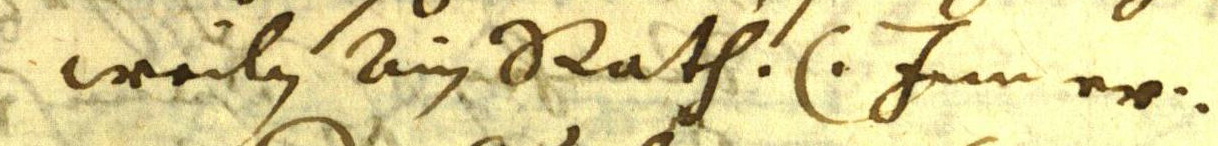weiln Ain Rath .(.Inn er¬
